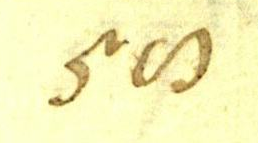58
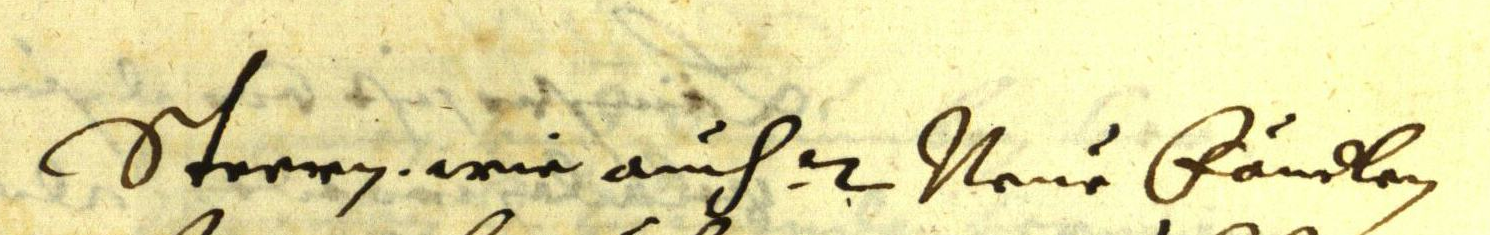Steern. wie aūch 2 Neūe Fāndlen
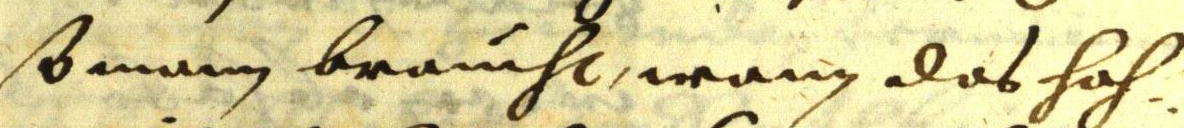so man braūcht, wann das hoch¬
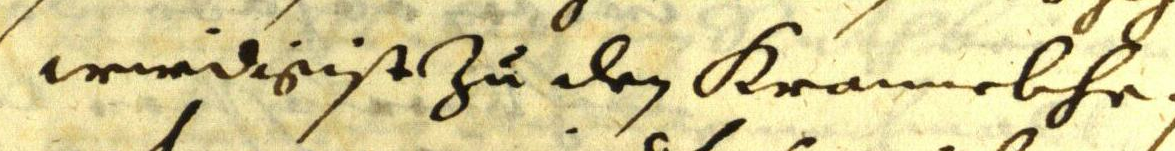wirdigist Zū den Krannckhen
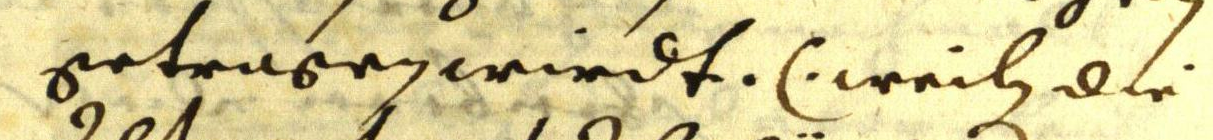getragen wirdt .(.weiln die
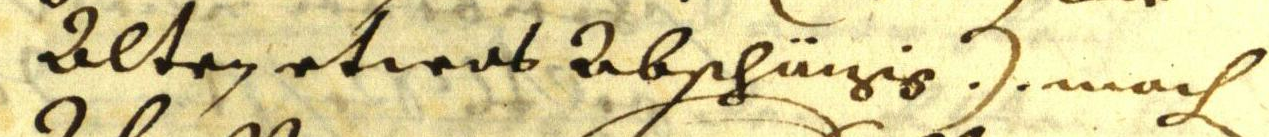Alten etwas Abschäzig.). mach
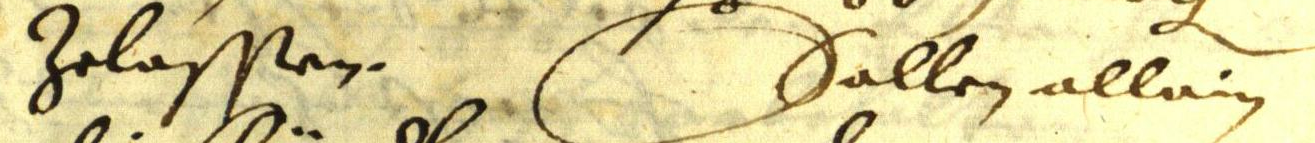Zelassen. Sollen allain
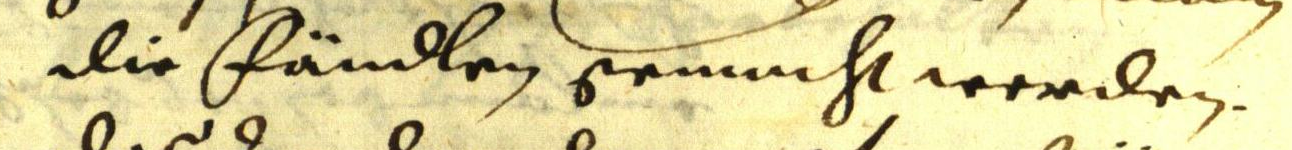die Fändlen gemacht werden.
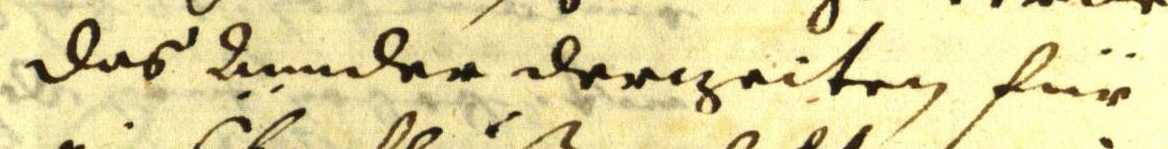das Annder derzeiten für
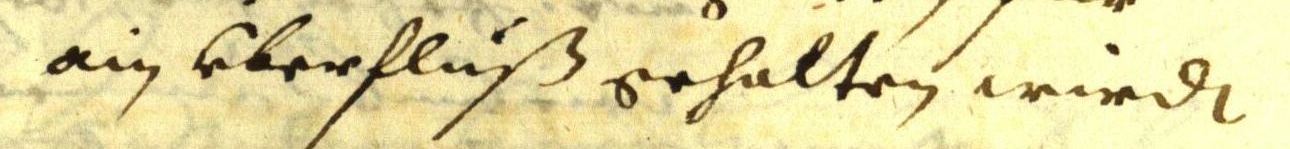ain v̈berflūß gehalten wirdt.
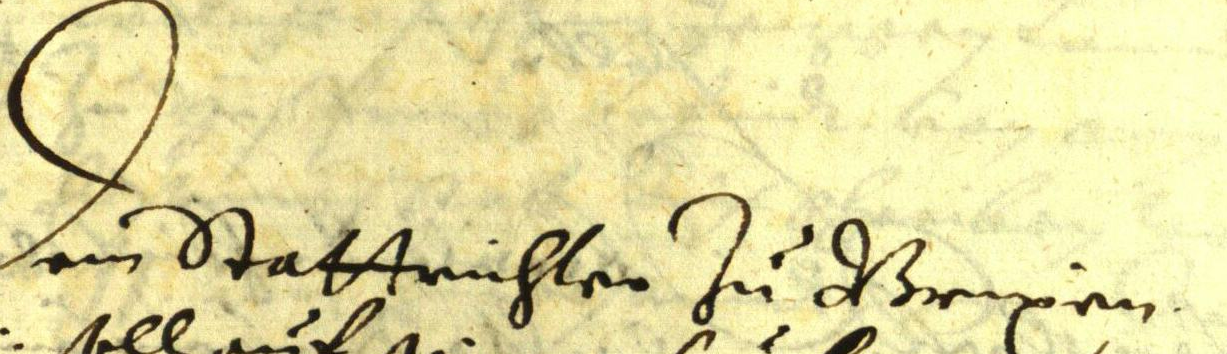Dem Stattrichter Zū Brixen
